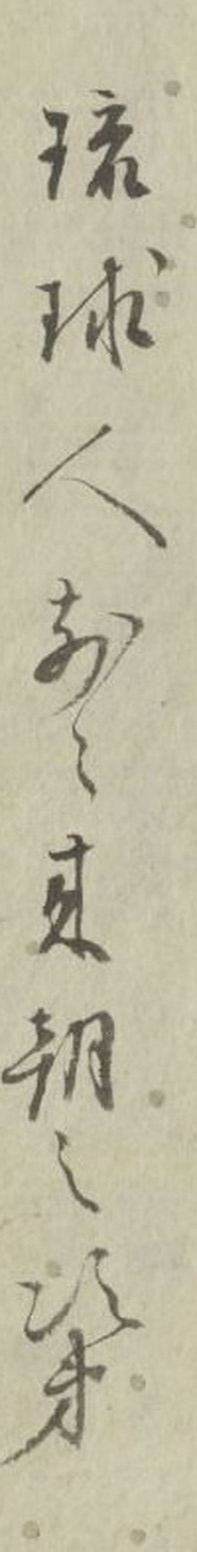琉球人前々来朝之次第
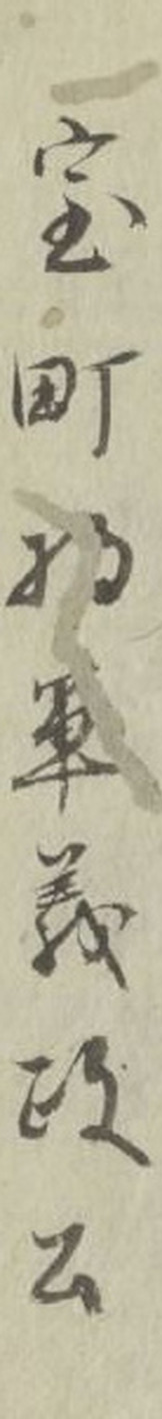室町将軍義政公
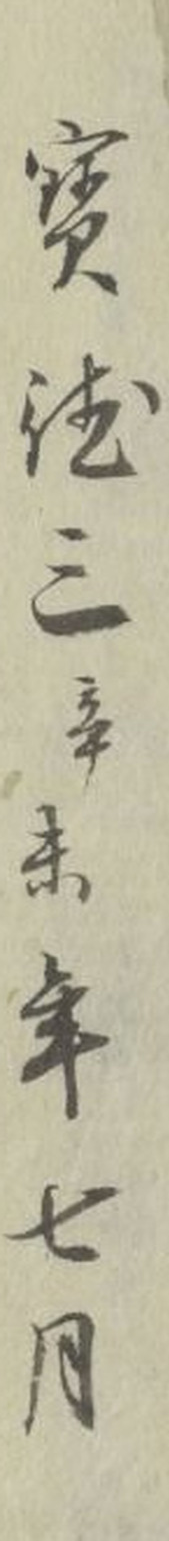宝徳三辛未年七月
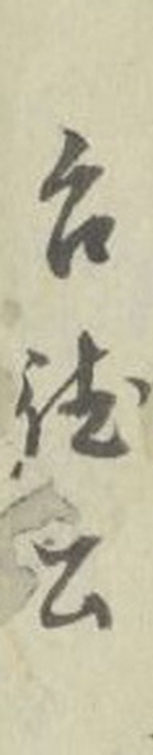台徳公
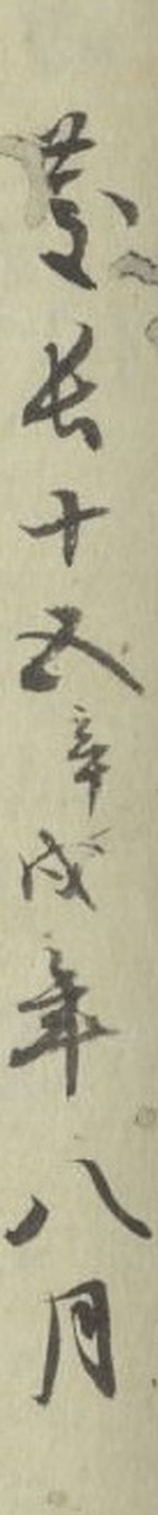慶長十五辛戌年八月
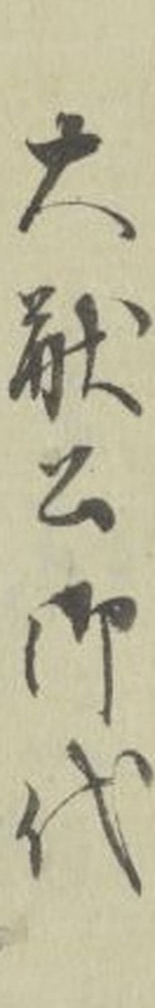大猷公御代
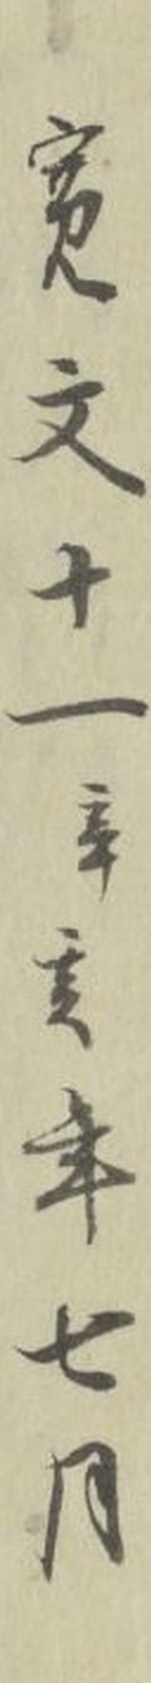寛文十一辛亥年七月
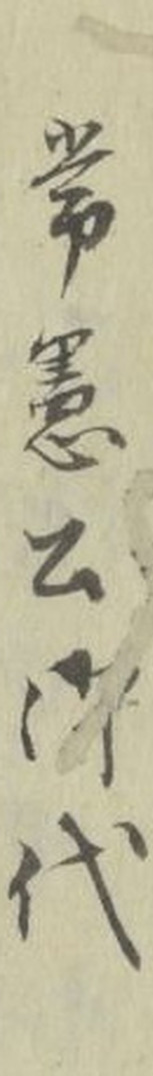常憲公御代
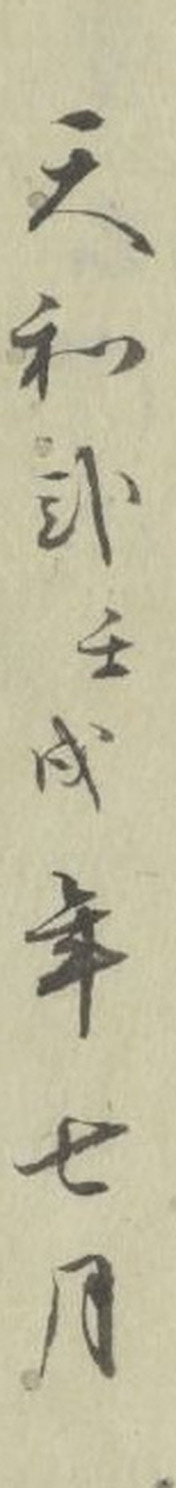天和弐壬戌年七月
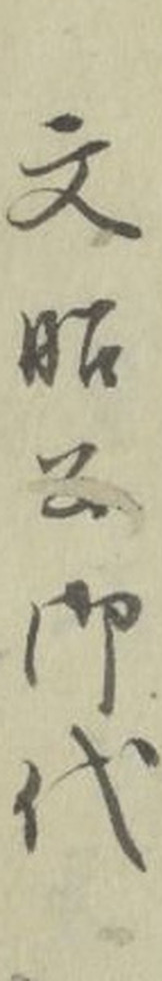文昭公御代

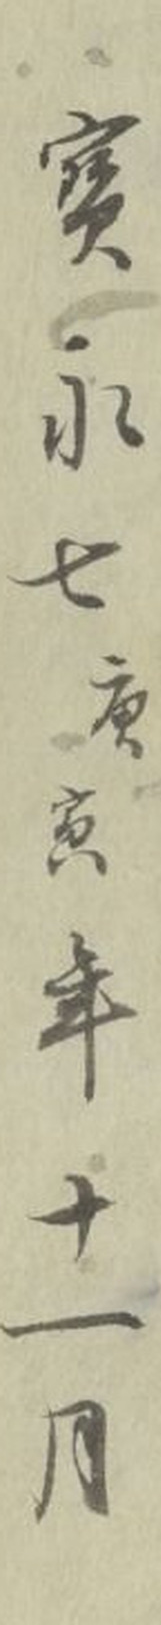宝永七庚寅年十一月
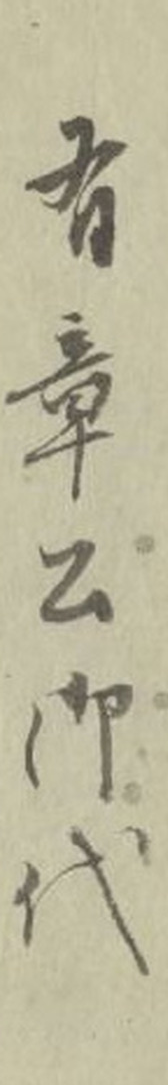有章公御代
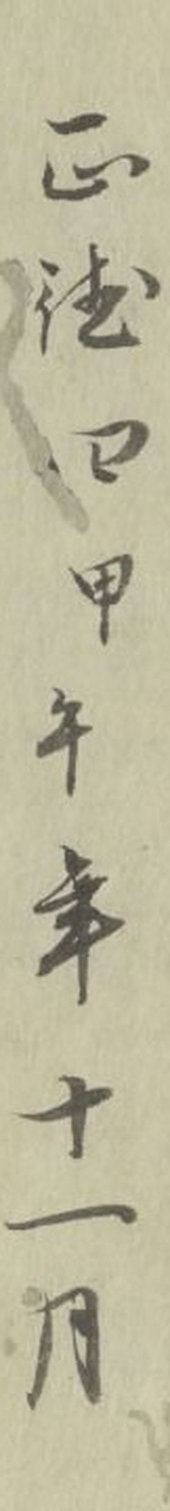正徳四甲午年十一月
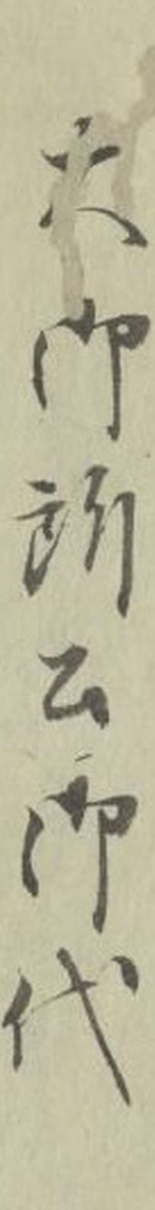大御所公御代
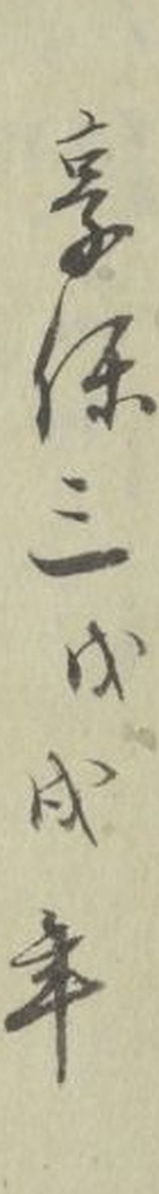享保三戊戌年
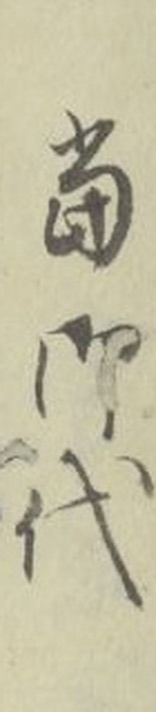当御代
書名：琉球来朝記 自一至七
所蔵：University of the Ryukyus Library
